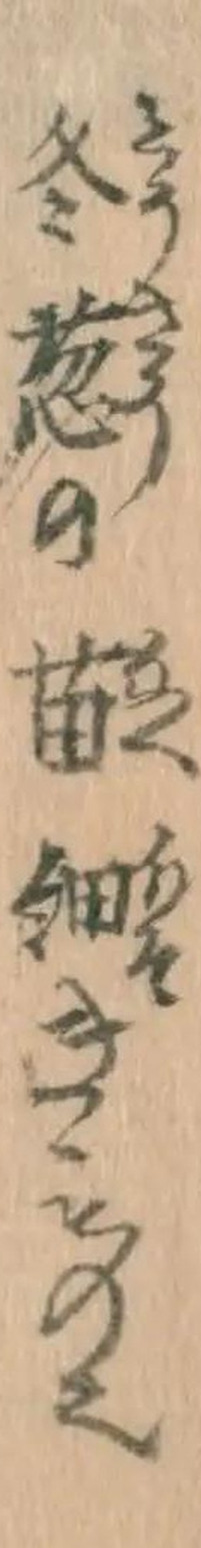冬葱の苗細きもの也
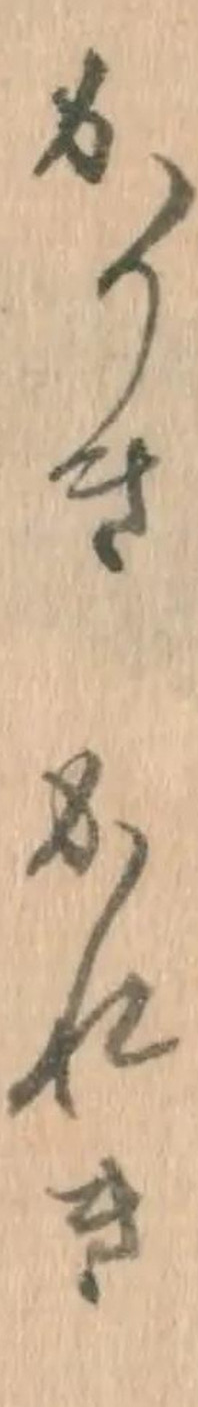かりきかれき
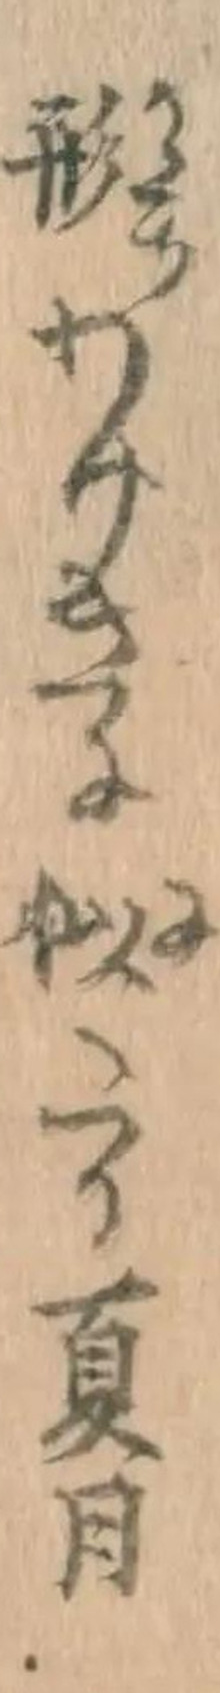形わけきに似たり夏月
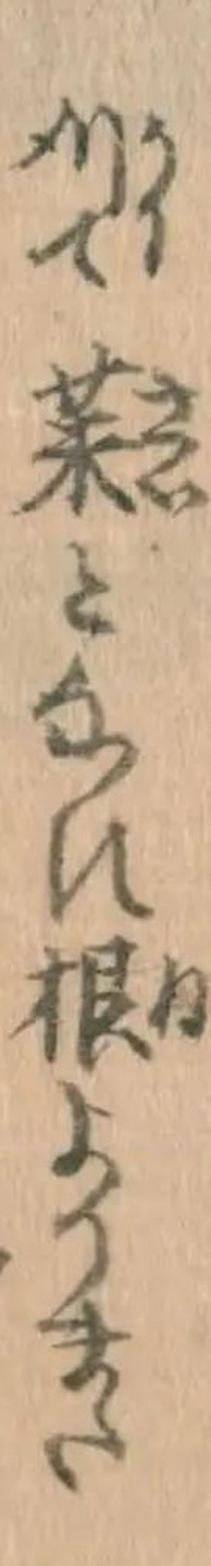刈て菜となす根よりまた
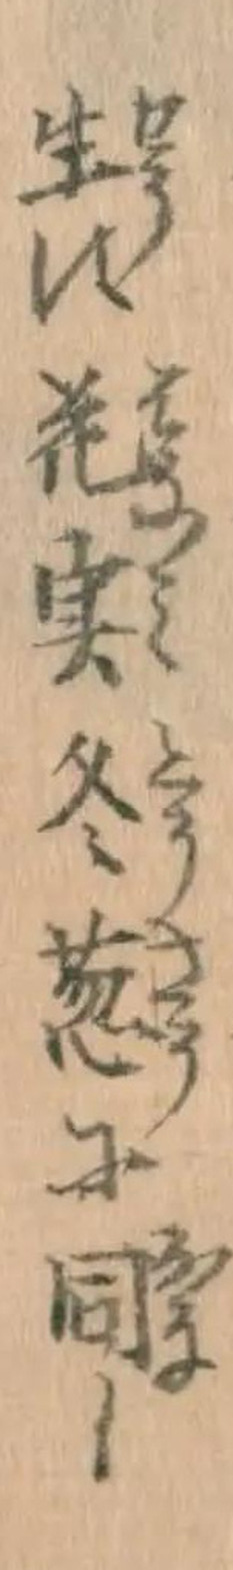生す花実冬葱に同し
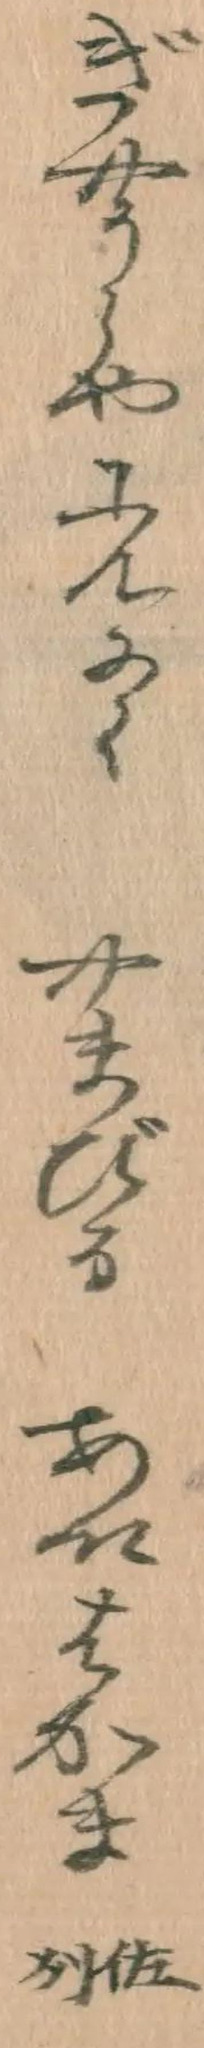ぎやうしやにんにくやまびるあいはかま佐州
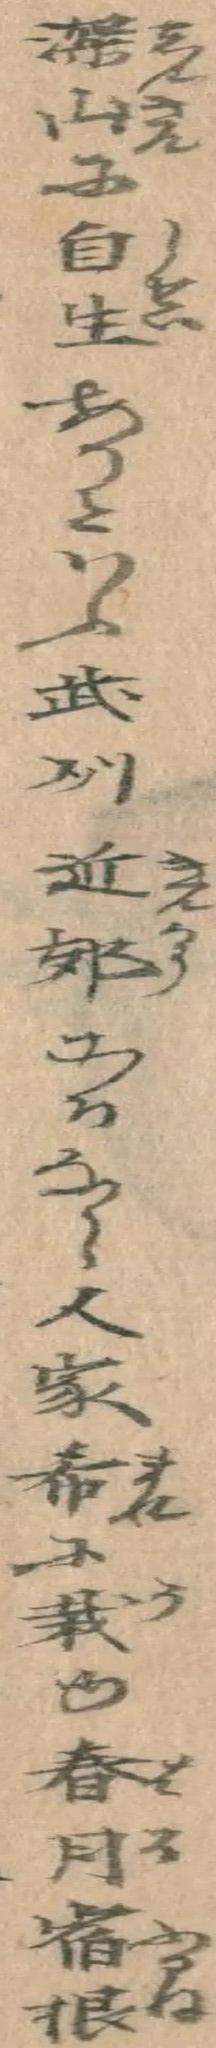深山に自生ありといふ武州近郊にはなし人家希に栽ゆ春月宿根
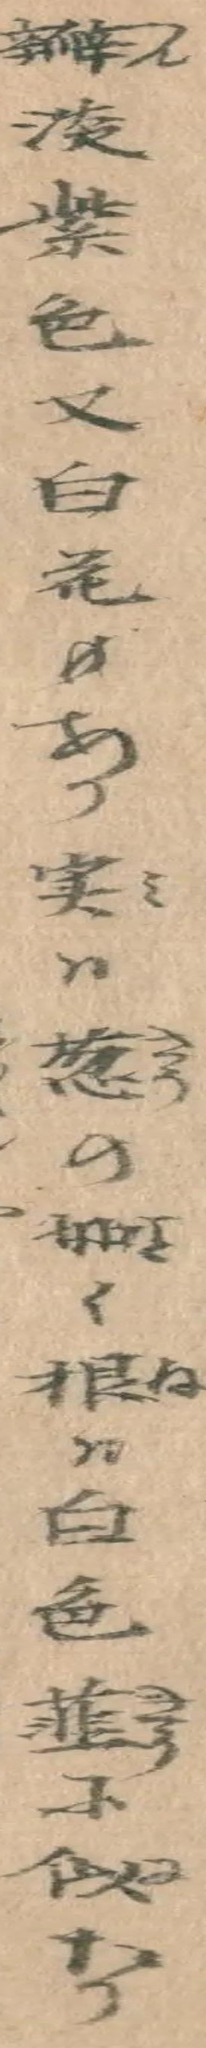弁淡紫色又白花もあり実は葱の如く根は白色韮に似たり
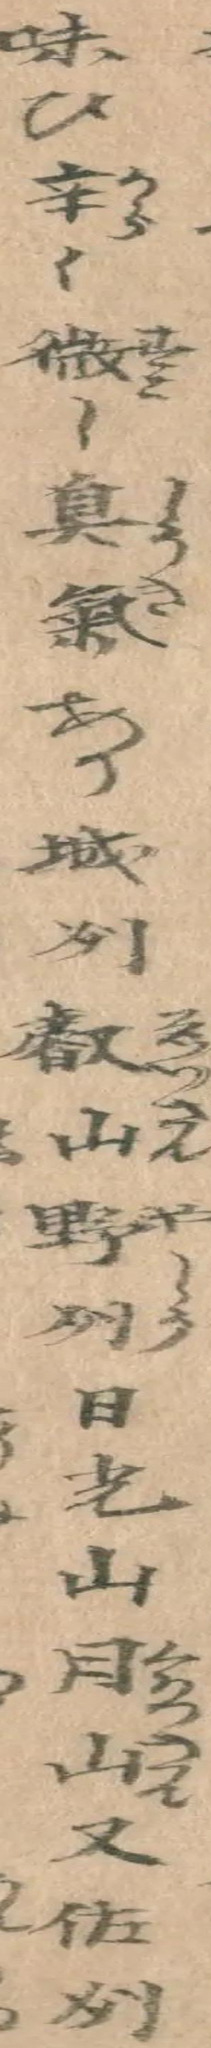味ひ辛く微し臭気あり城州叡山野州日光山月山又佐州
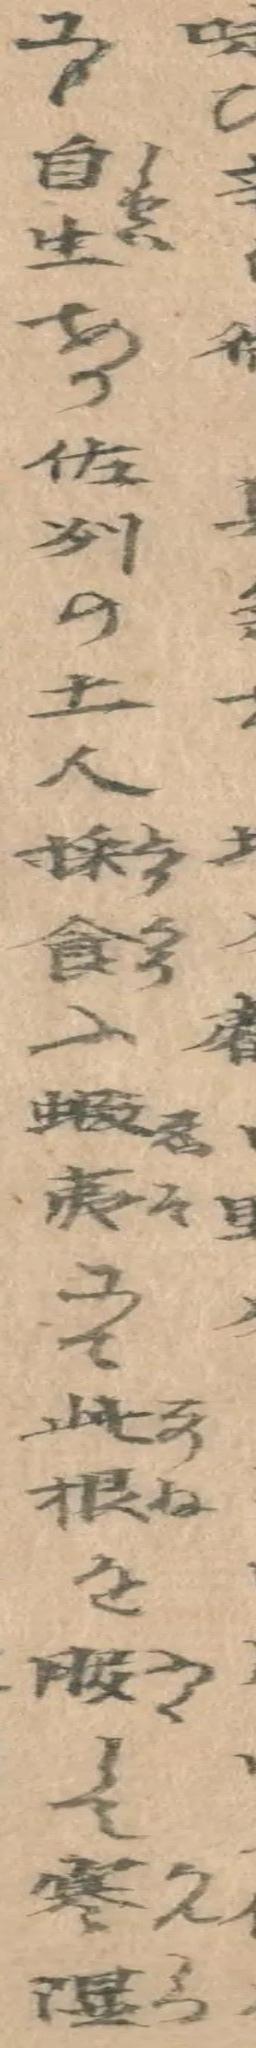にも自生あり佐州の土人採食ふ蝦夷にて此根を服して寒湿
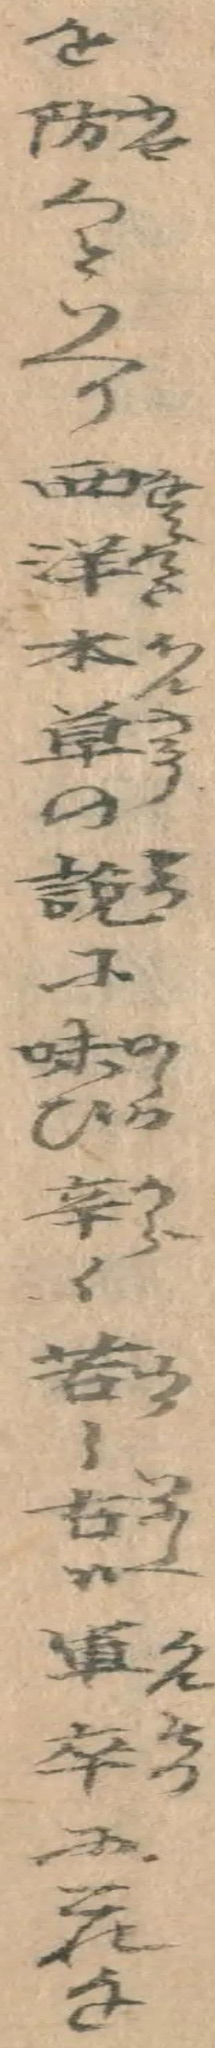を防くといへり西洋本草の説に味ひ辛く苦し古は軍卒に花を

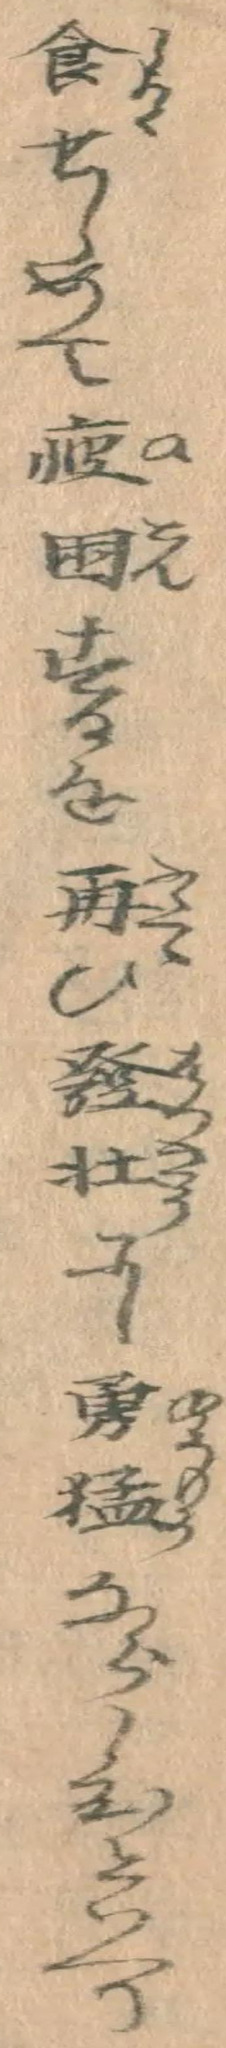食せしめて疲困するを再ひ発壮にし勇猛ならしむといへり

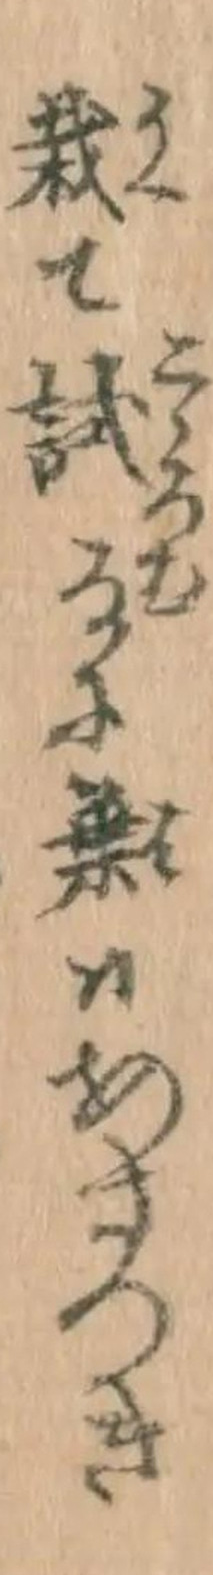栽て試るに葉はあさつき
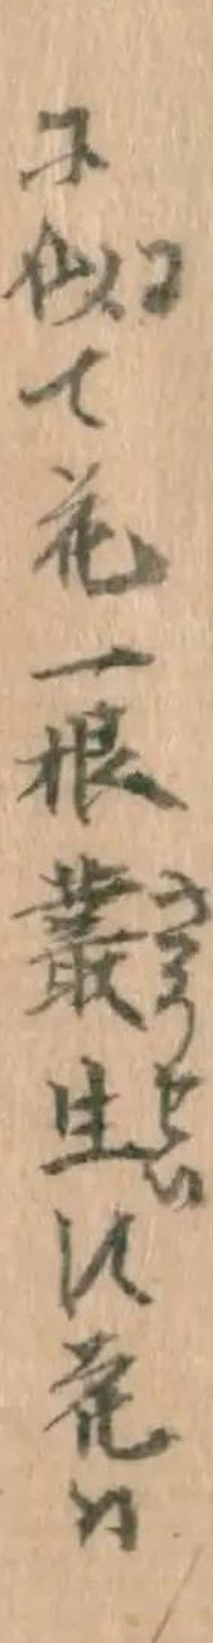に似て花一根叢生す花は
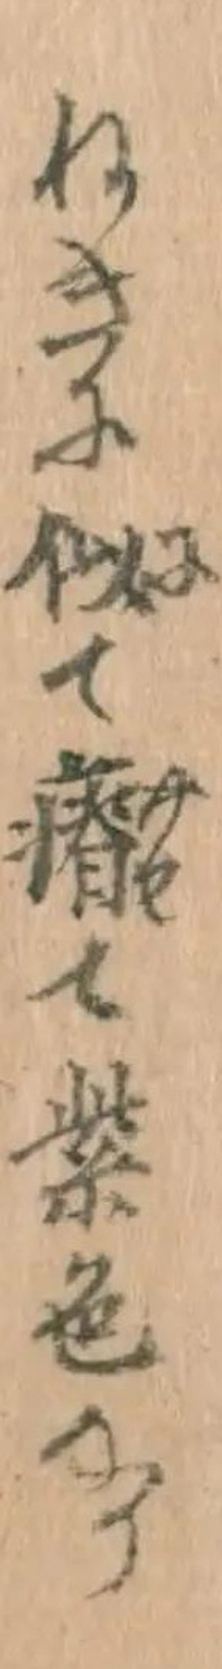ねきに似て瘠て紫色なり
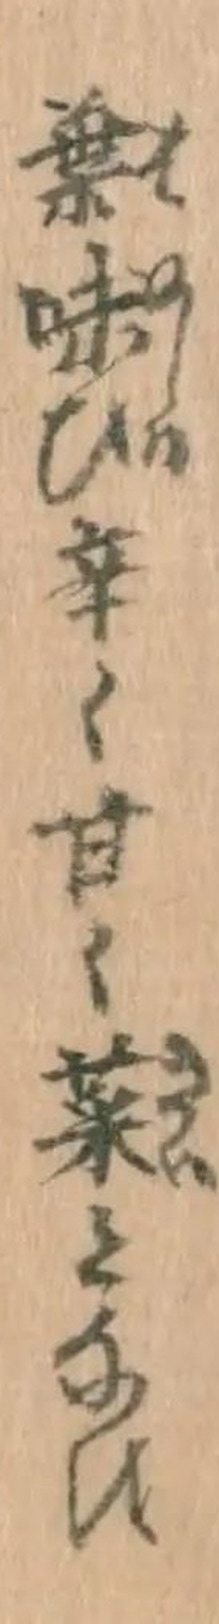葉味ひ辛く甘く菜となす
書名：本草図譜. 巻43-45
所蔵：国立国会図書館 National Diet Library, JAPAN
